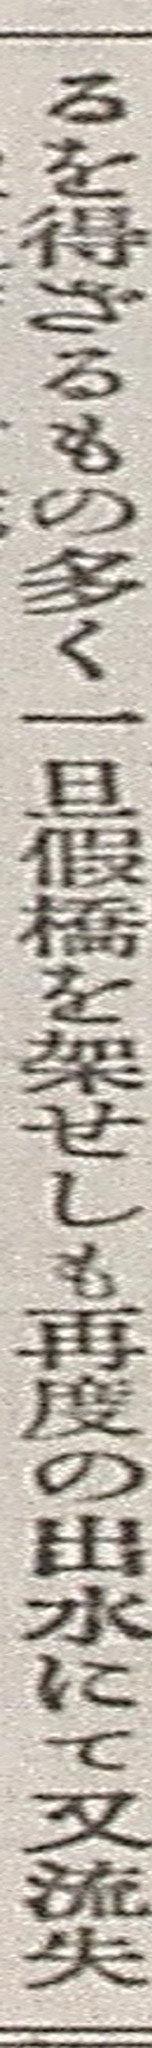るを得ざるもの多く一旦仮橋を架せしも再度の出水にて又流失
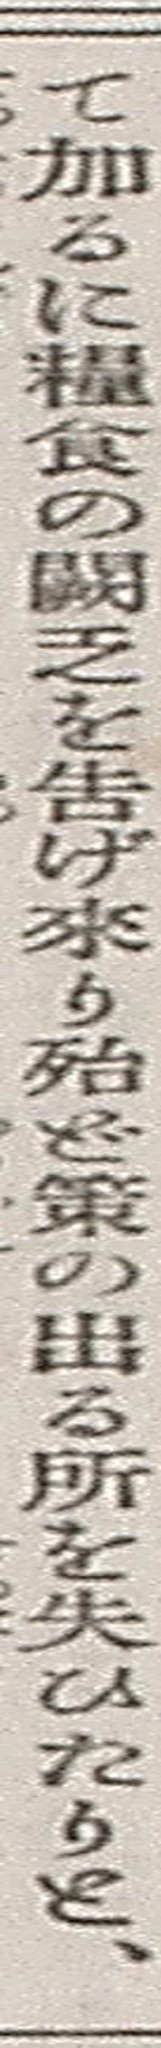て加るに糧食の闕乏を告げ来り殆ど策の出る所を失ひたりと、
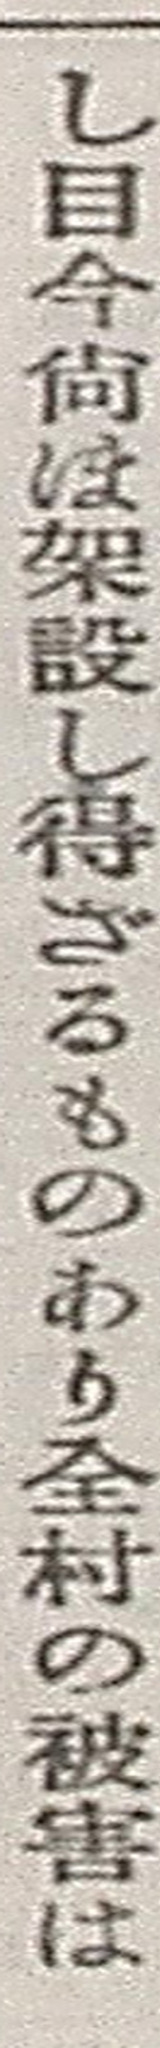し目今尚ほ架設し得ざるものあり同村の被害は
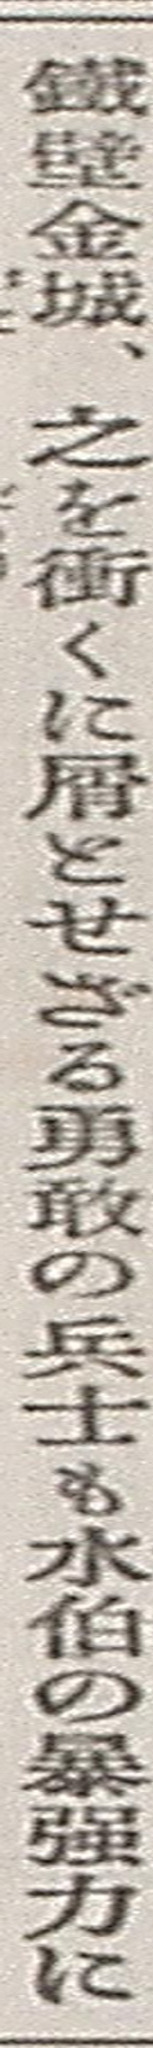鉄壁金城、之を衝くに屑とせざる勇敢の兵士も水伯の暴強力に
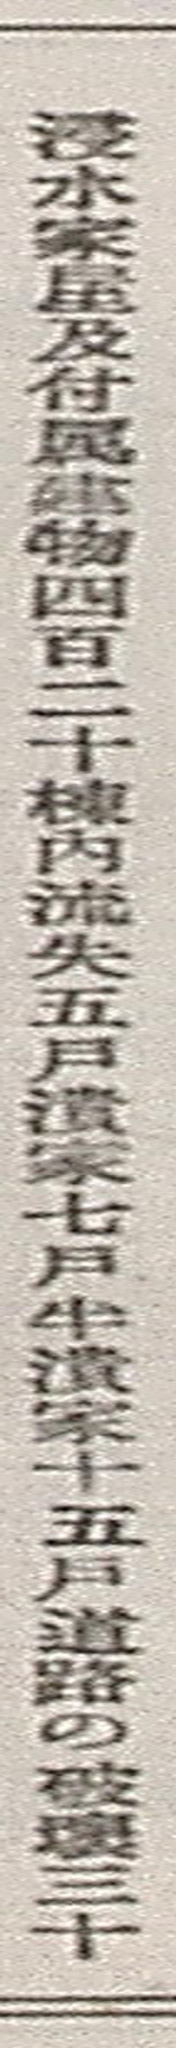浸水家屋及付属建物四百二十棟内流失五戸潰家七戸半潰家十五戸道路の破壊三十
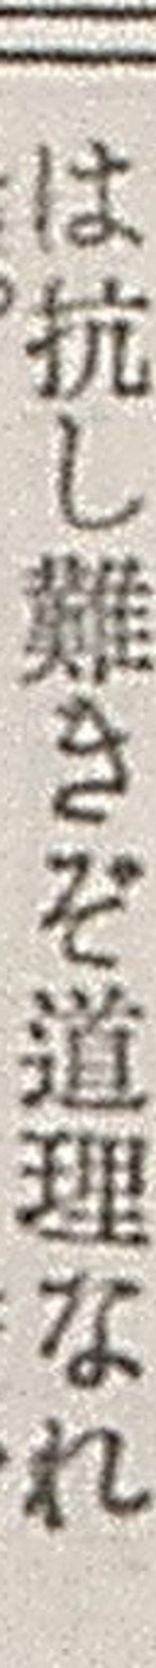は抗し難きぞ道理なれ
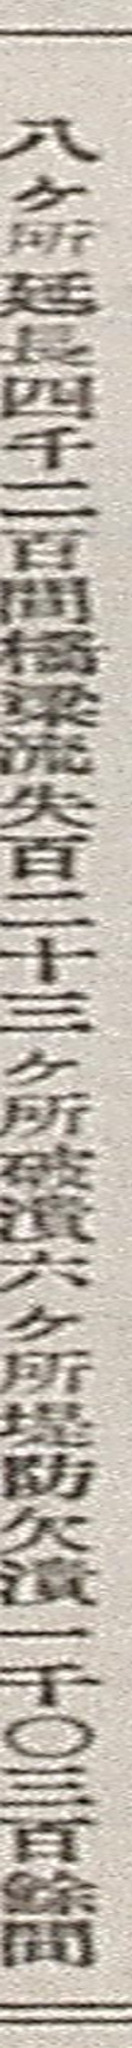八ヶ所延長四千二百間橋梁流失百二十三ヶ所破潰六ヶ所堤防欠潰一千０三百餘間
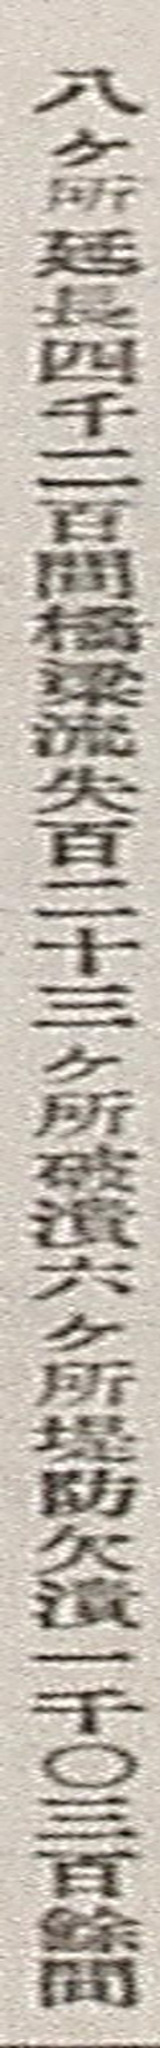八ヶ所延長四千二百間橋梁流失百二十三ヶ所破潰六ヶ所堤防欠潰一千０三百餘間
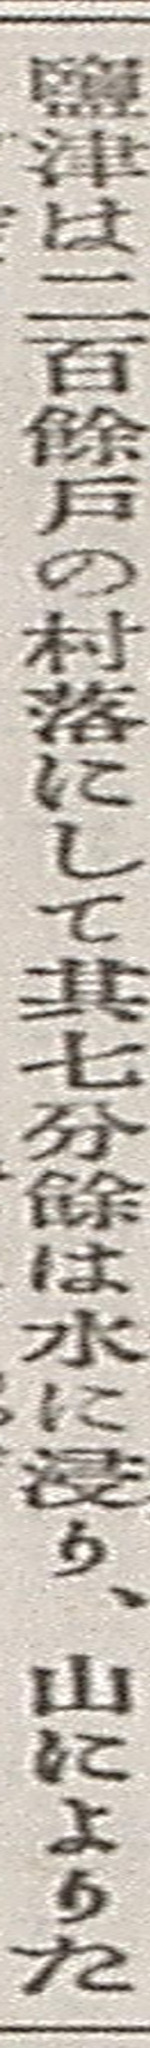塩津は二百餘の村落にして其七分餘は水に浸り、山によりた
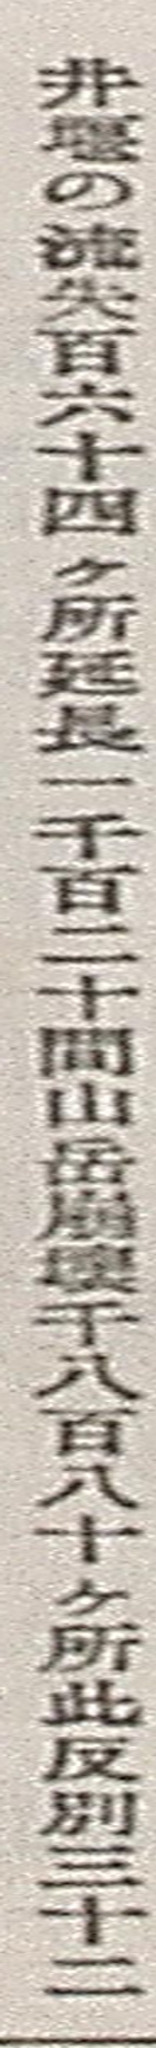井堰の流失百六十四ヶ所延長一千百二十間山岳崩壊千八百八十ヶ所此反別三十二
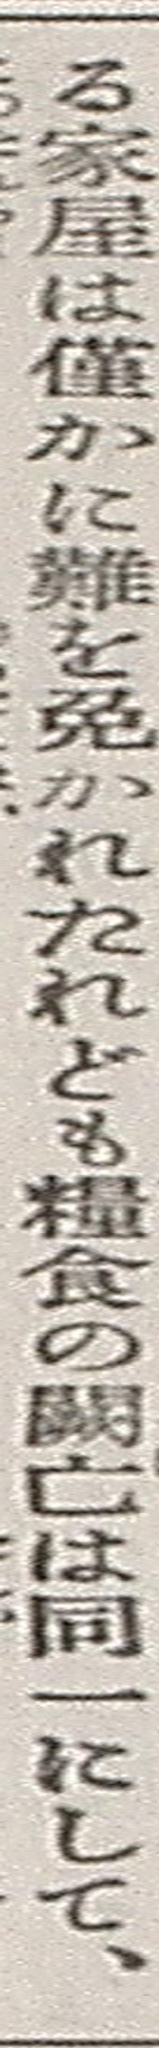る家屋は僅かに難を免かれたれども糧食の闕亡は同一にして、
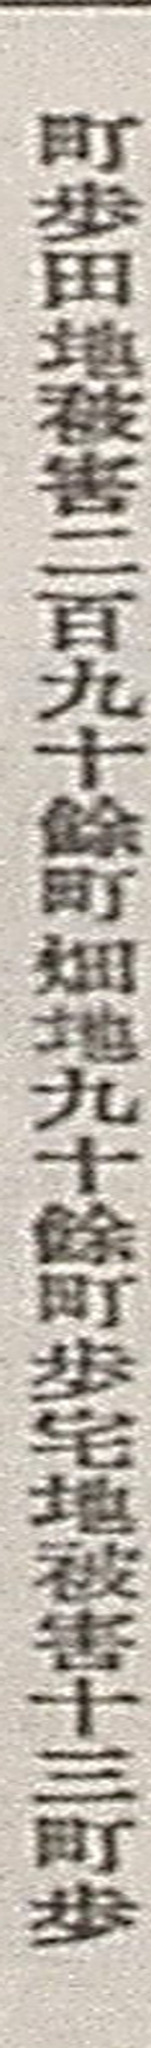町歩田地被害二百九十餘町畑地九十餘町歩宅地被害十三町歩
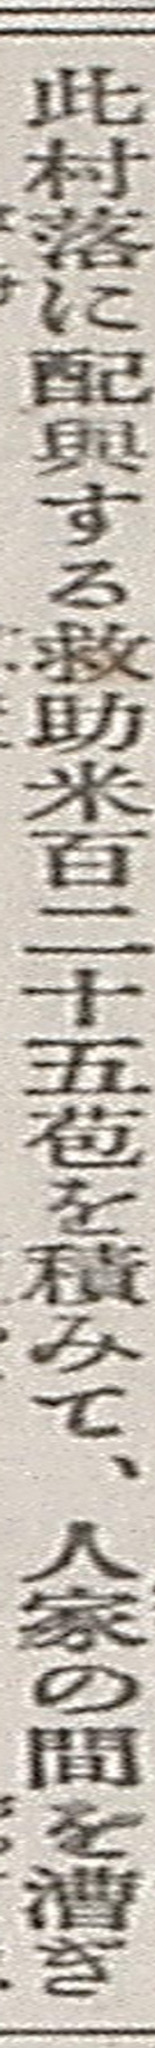此村落に配輿する救助米百二十五苞を積みて、人家の間を漕ぎ
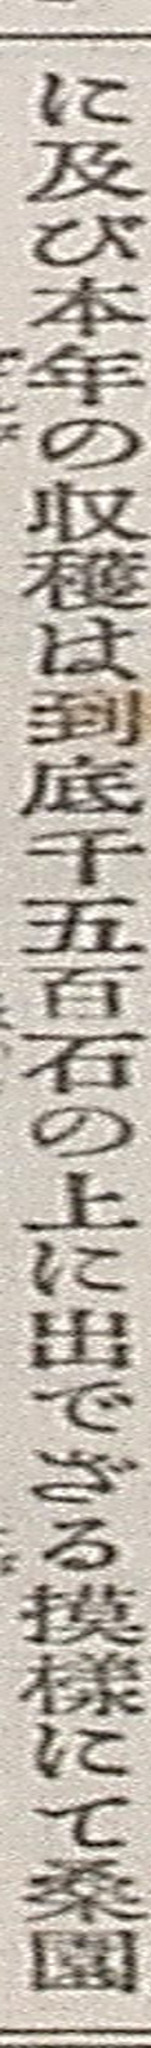に及び本年の収穫は到底千五百石の上に出でざる模様にて桑園
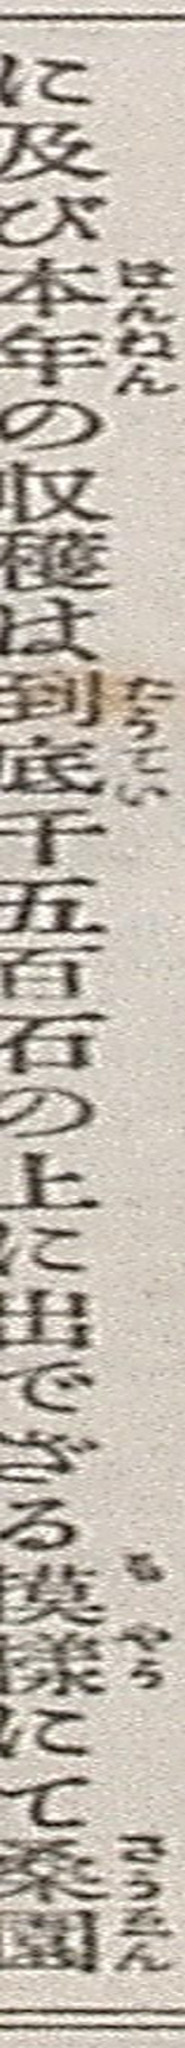に及び本年の収穫は到底千五百石の上に出でざる模様にて桑園
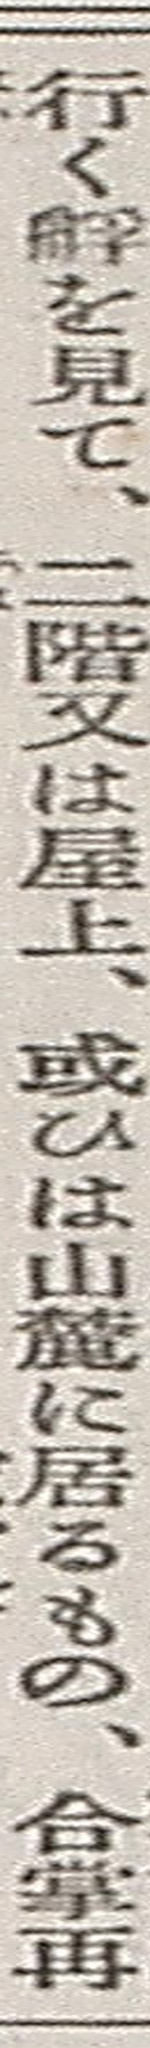行く艀を見て、二階又は屋上、或ひは山麓に居るもの、合掌再
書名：風俗畫報臨時増刊第百二十八號　洪水被害録（下）
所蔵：東京大学地震研究所図書室 Earthquake Research Institute Library, The University of Tokyo, JAPAN
